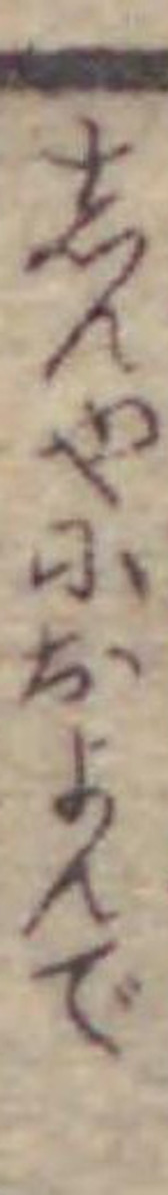しんやにおよんで
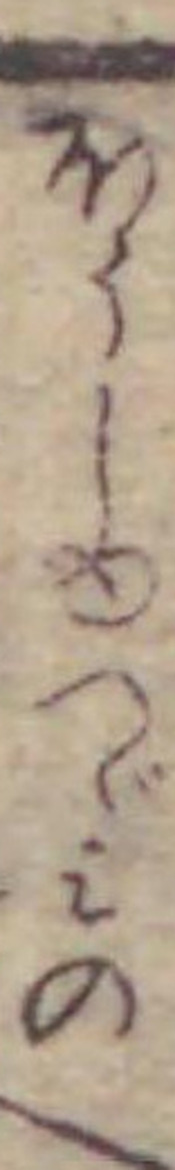ほうしゆつゞみの
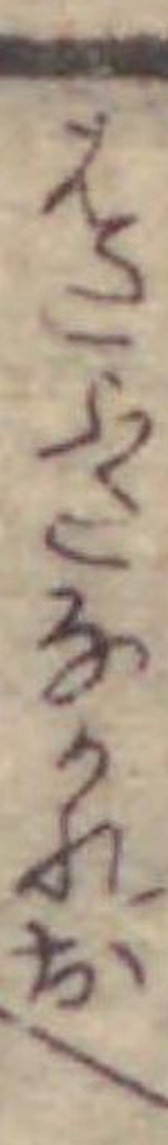はたふたなかれお
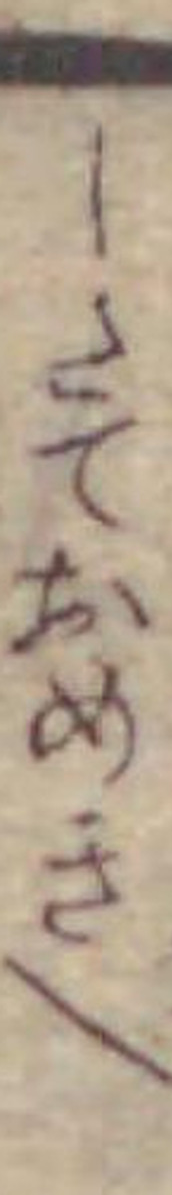したておめき
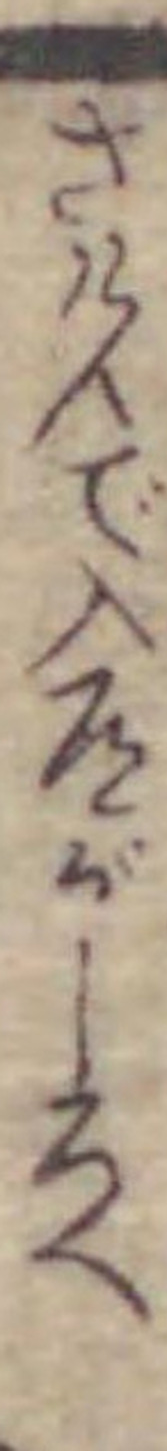さけんで入道がしろへ
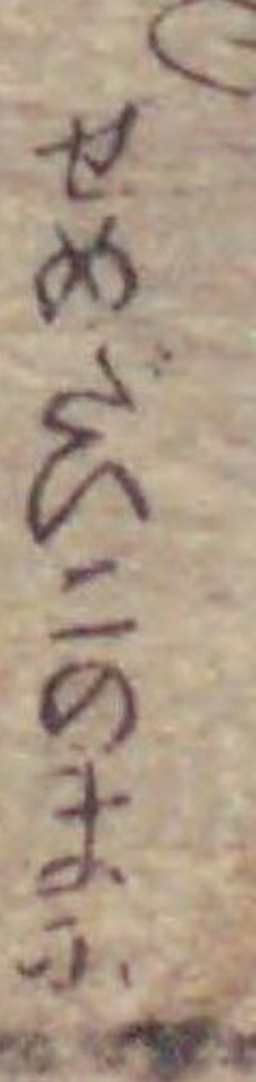せめだいこのまに
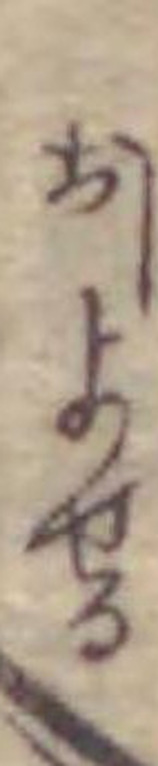おしよせる
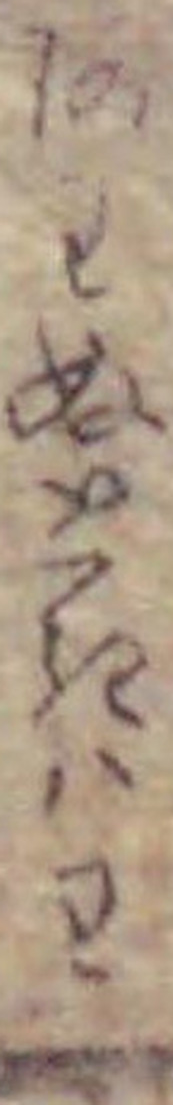あわぬときはわ
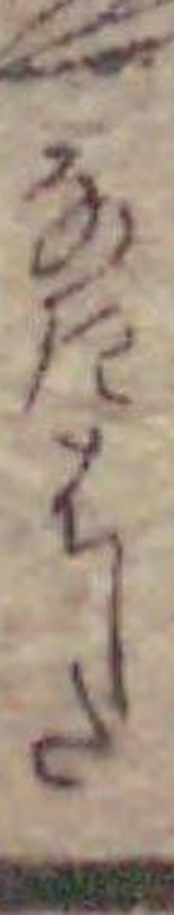なきはした
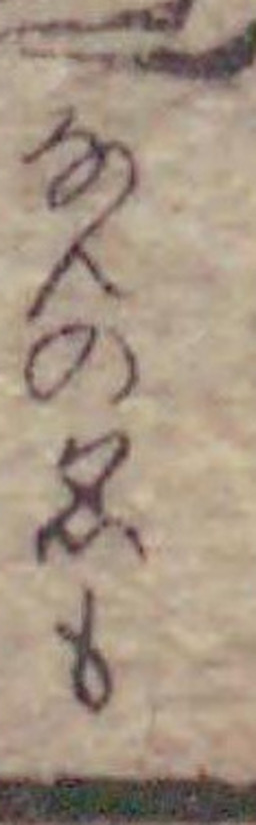なんの名も
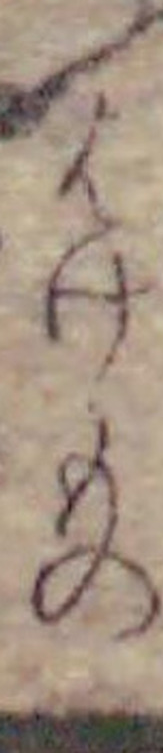はけもの
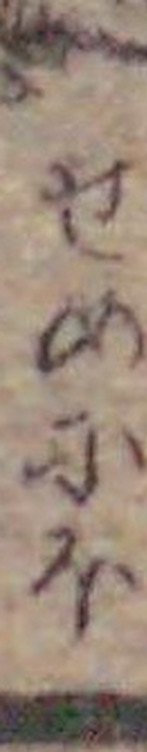せめにほ

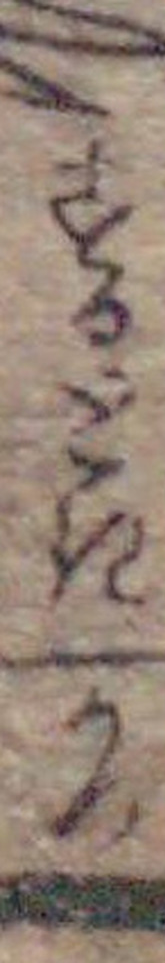するときかつ
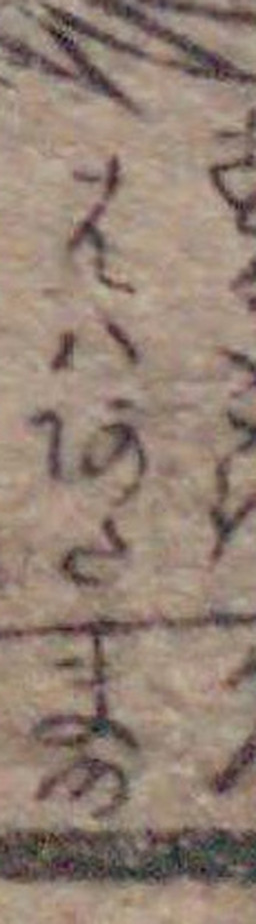ははあたまの
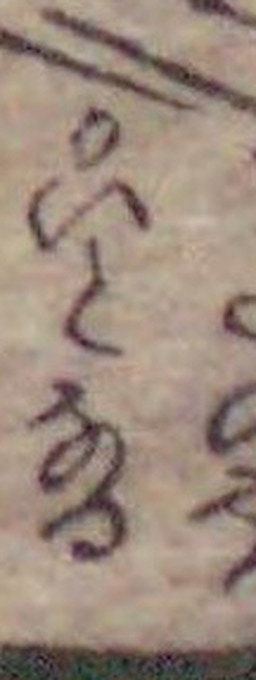かいとなる
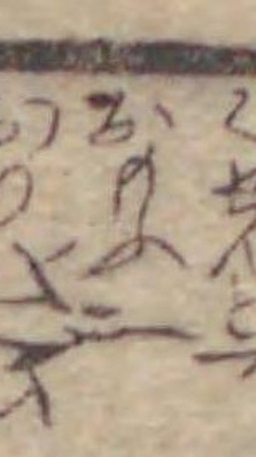おもふ
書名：化物仲間破 : 2巻
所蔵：国立国会図書館 National Diet Library, JAPAN
